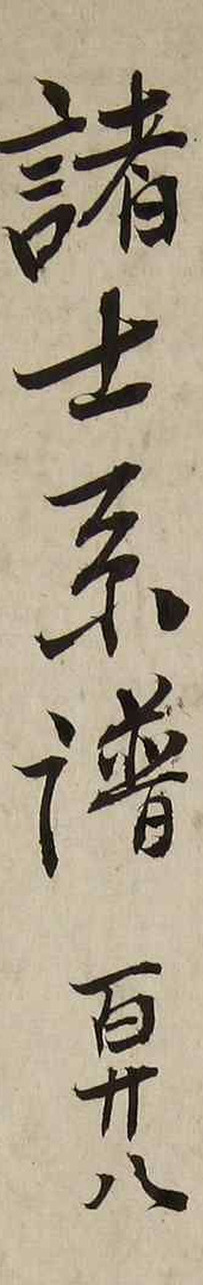諸士系譜百廿八

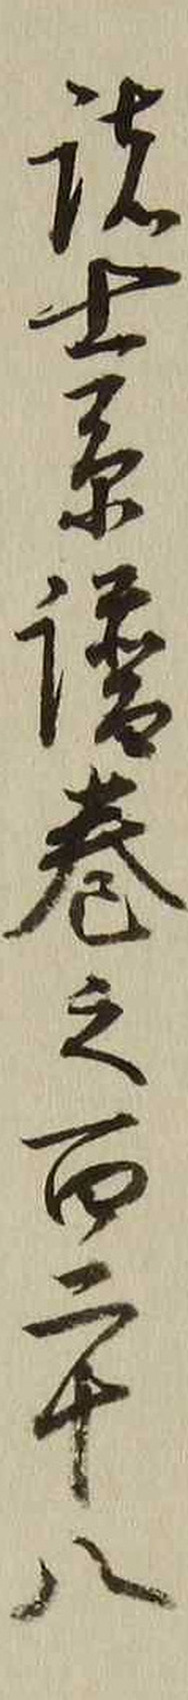諸士系譜巻之百二十八
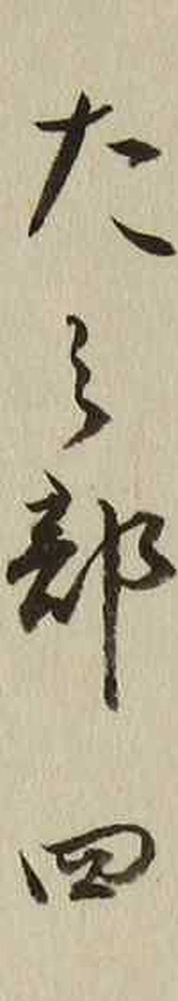た之部四
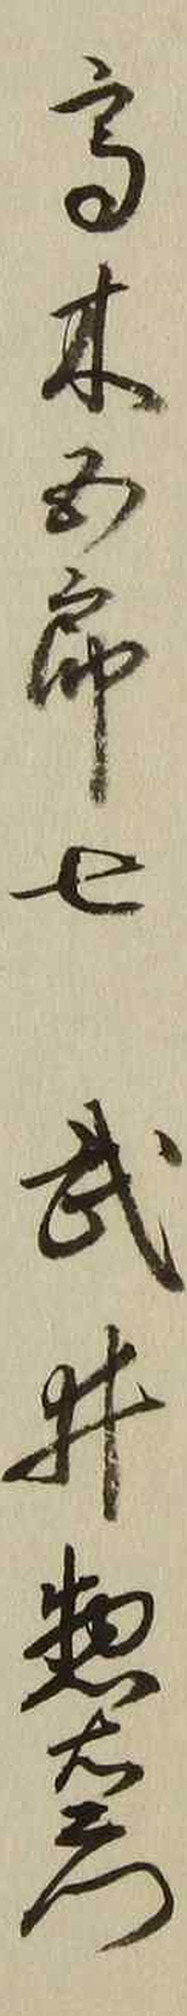高木五郎七武井惣右衛門
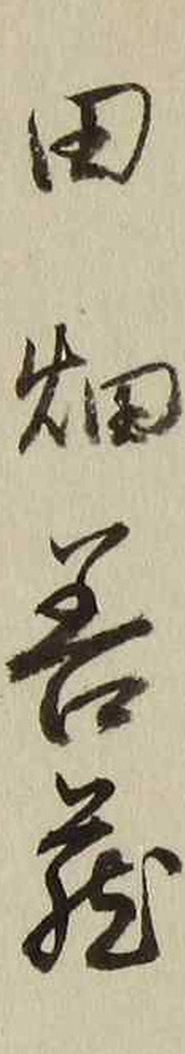田畑善蔵

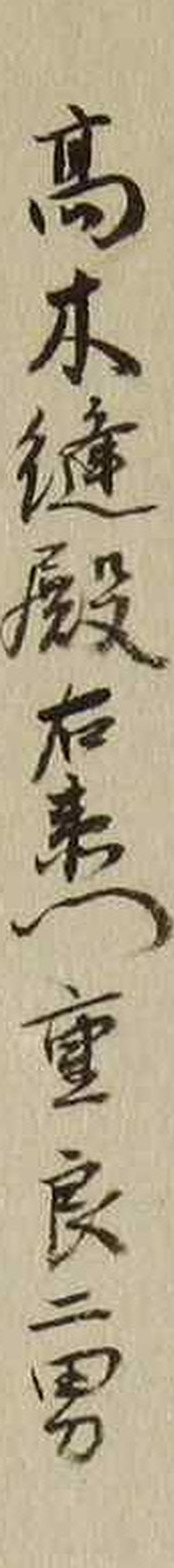高木縫殿右衛門重良二男
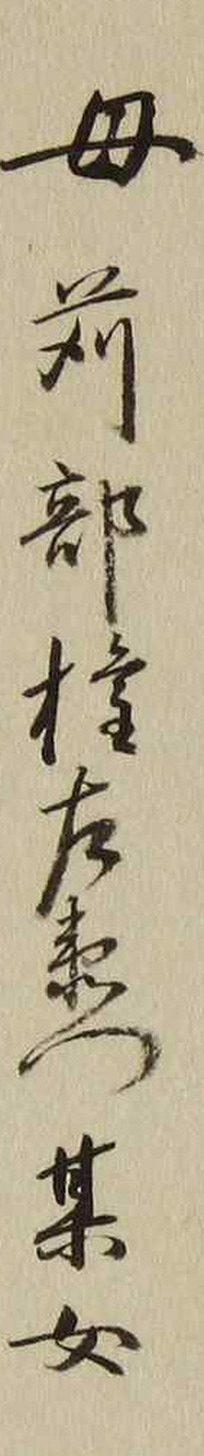母苅部権右衛門某女
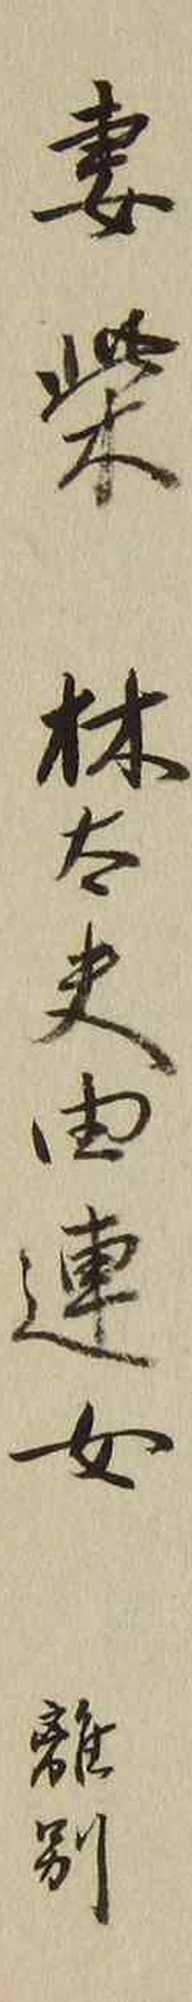妻柴林太夫由連女離別
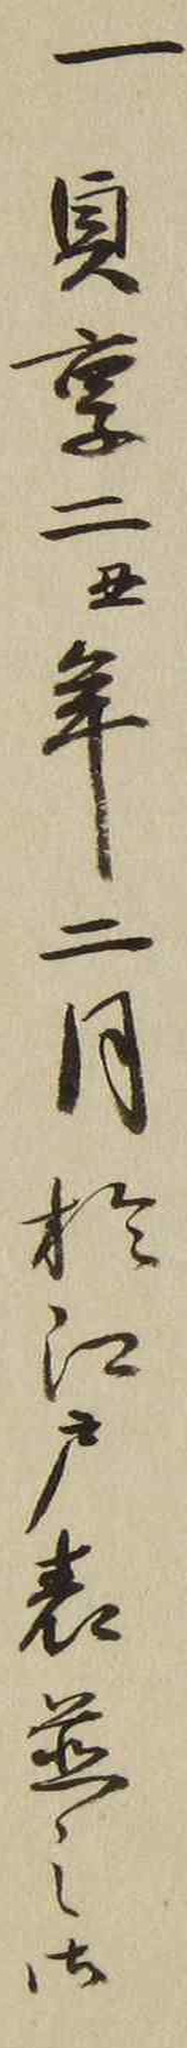一貞享二丑年二月於江戸表並之御

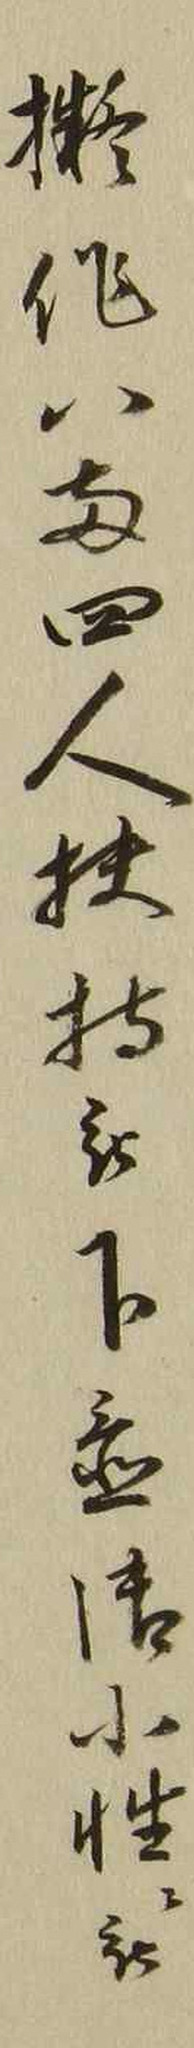擬作八両四人扶持被下置御小性ニ被
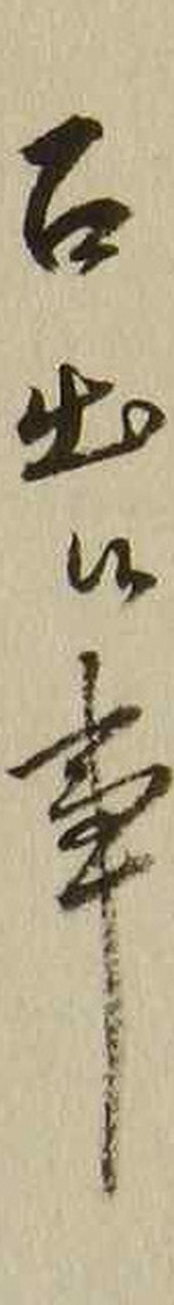召出候事
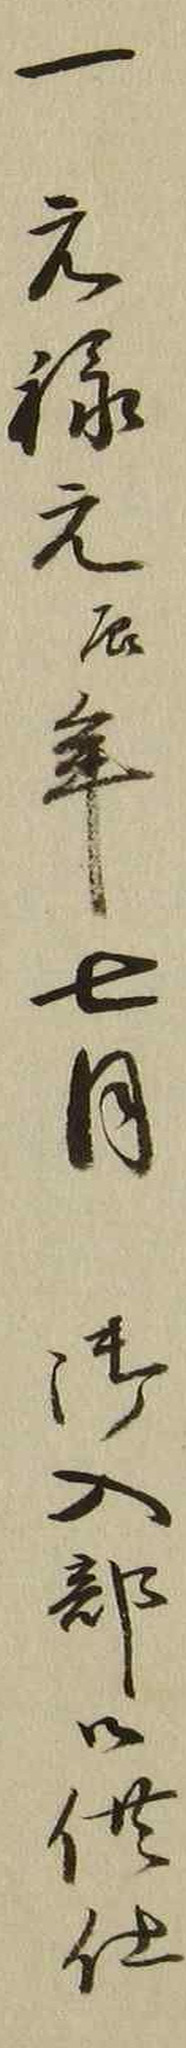一元禄元辰年七月御入部御供仕
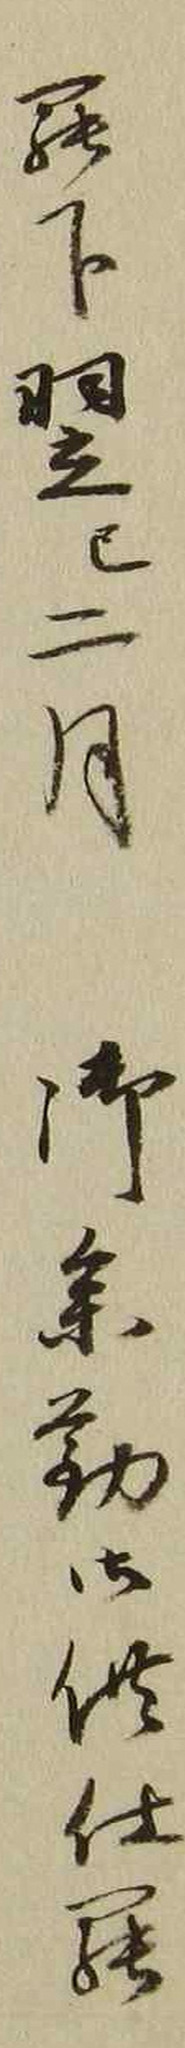罷下翌巳二月御参勤御供仕罷
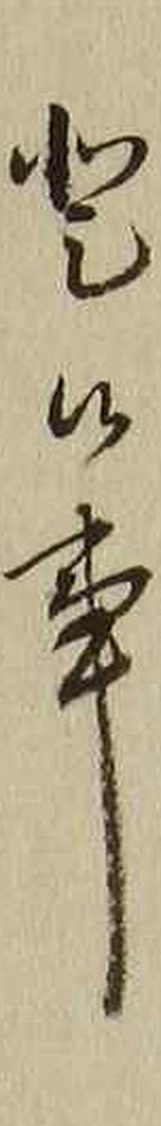登候事
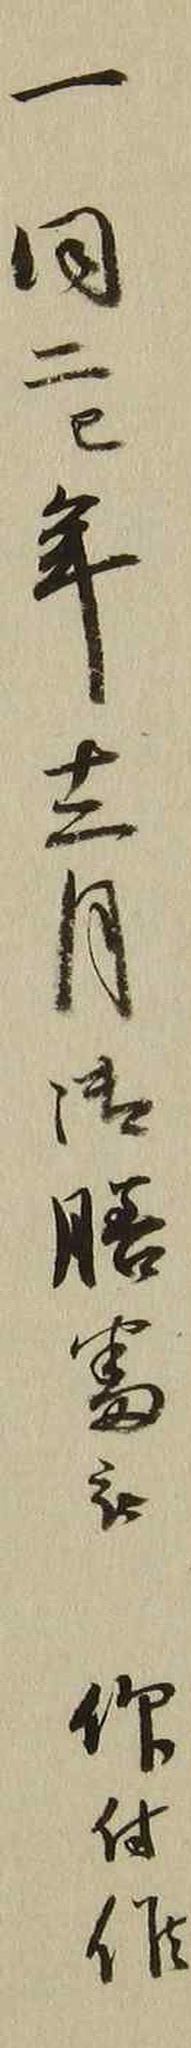一同二巳年十二月御膳番被仰付候
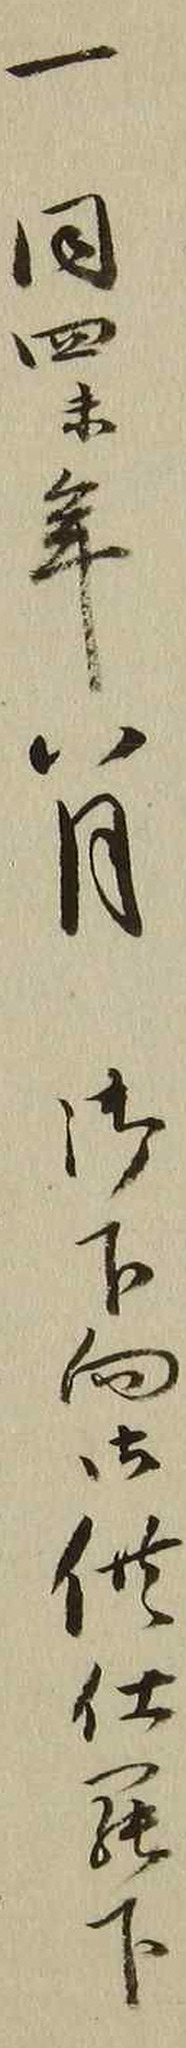一同四未年八月御下向御供仕罷下
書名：諸士系譜　巻之128　た之部4
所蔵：会津若松市立会津図書館
